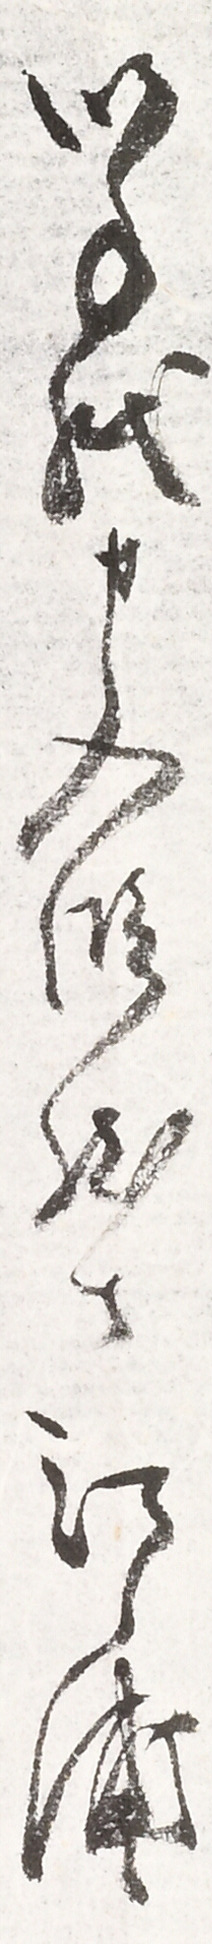以手紙申入段然は江浦
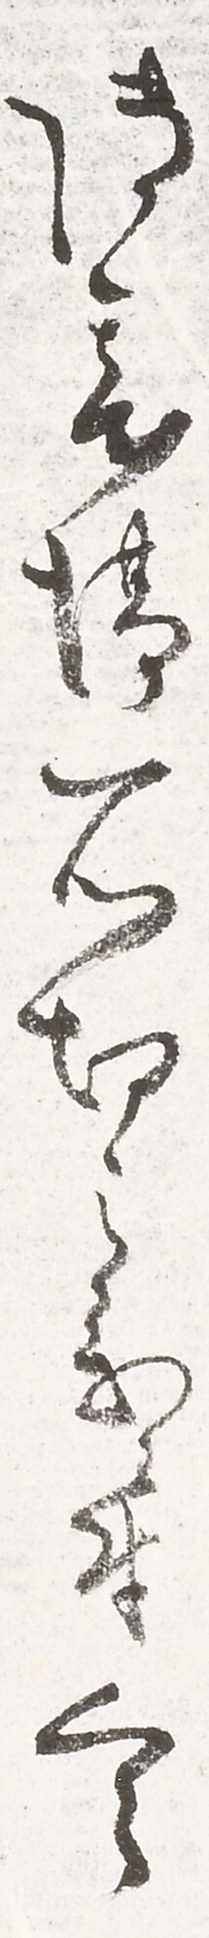御台場石切之義に付今
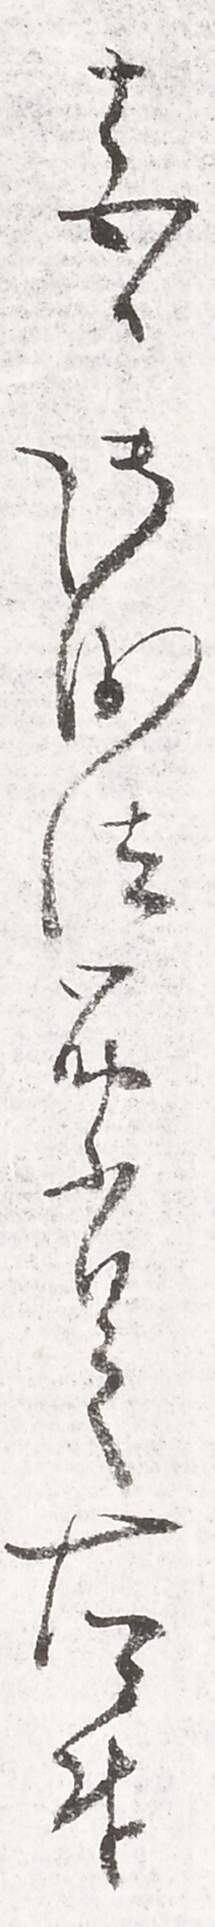十五日御沙汰筋有之右に付
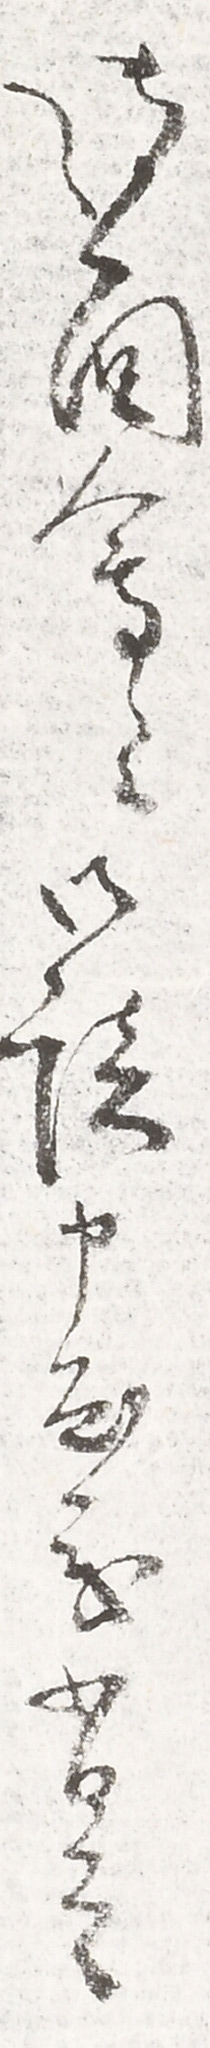御面会にて御談申度義有之
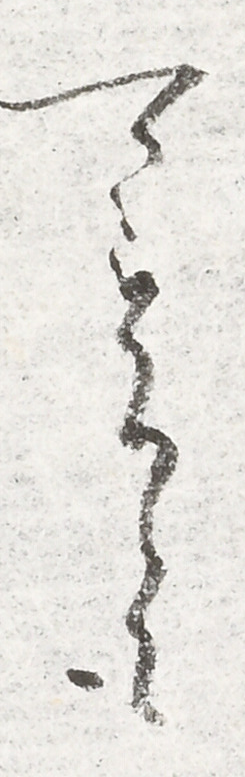可被下候以上
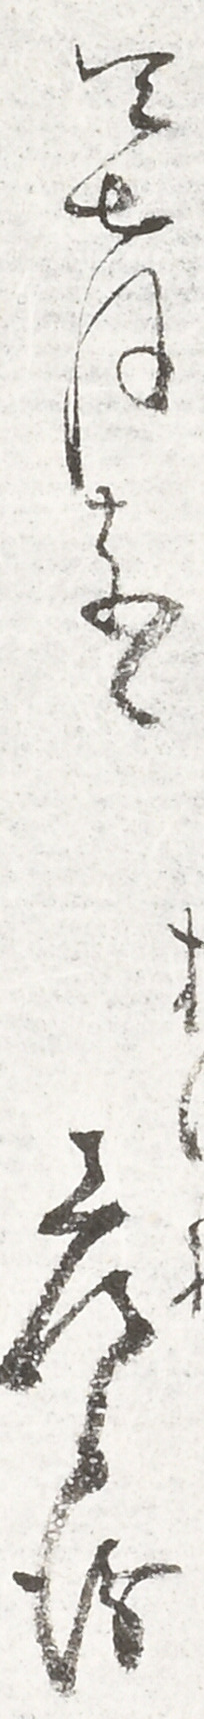閏七月十五日彦兵衛
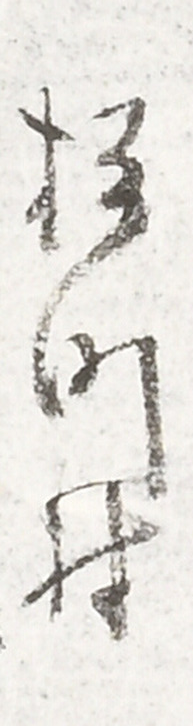板町村
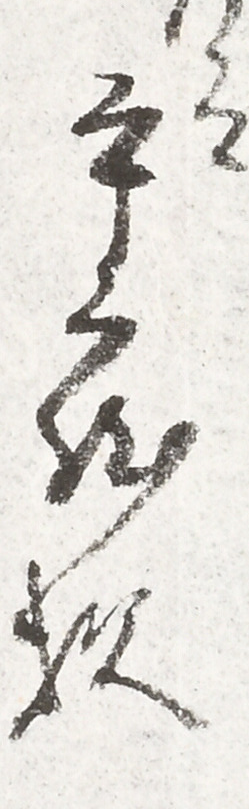平蔵様
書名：（書状）
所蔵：伊那市立高遠町図書館・合同会社AMANE
